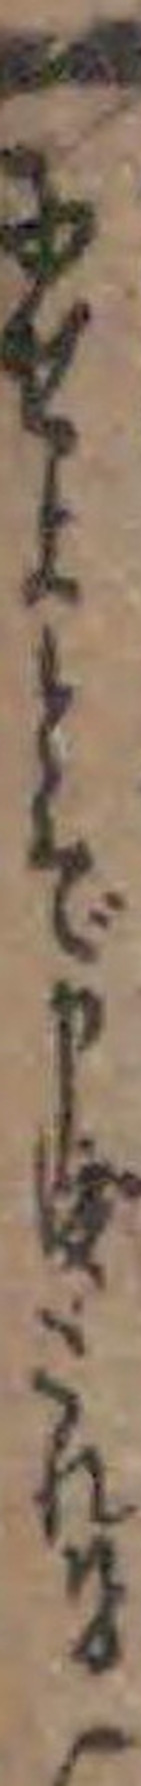にせよとぞ申渡されける
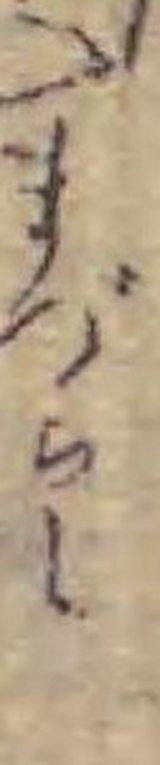まづらし
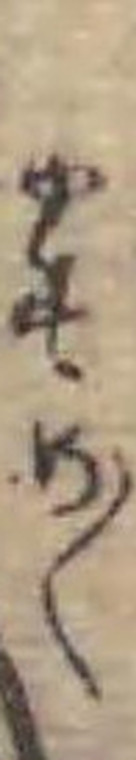やすめ〳〵
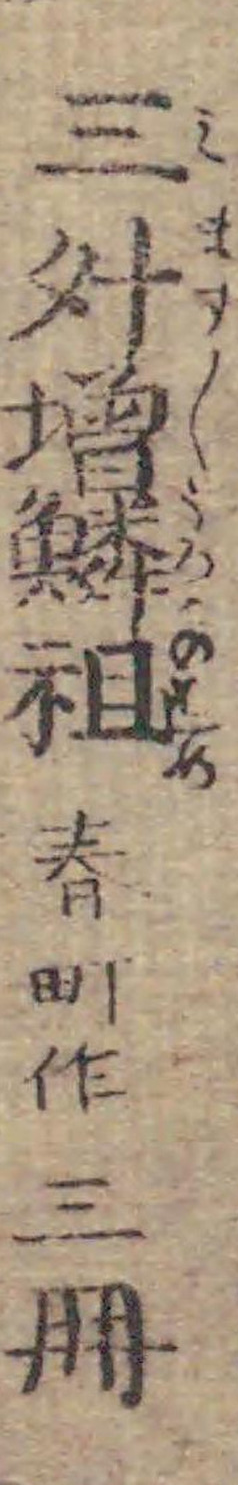三升増鱗祖春町作三冊

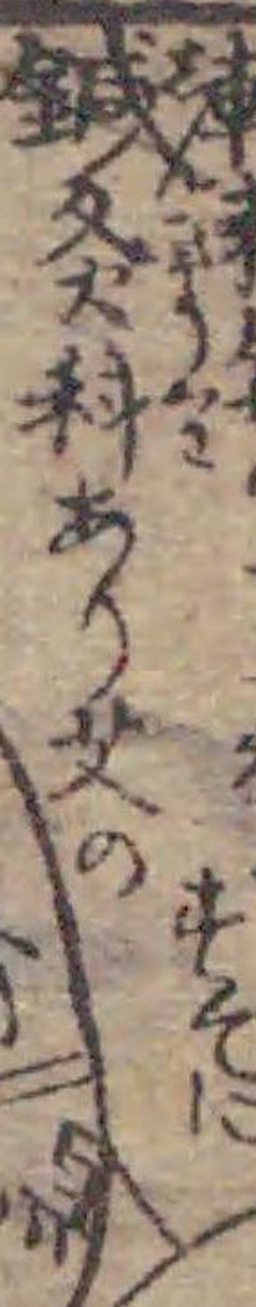鍼灸科あり艾の
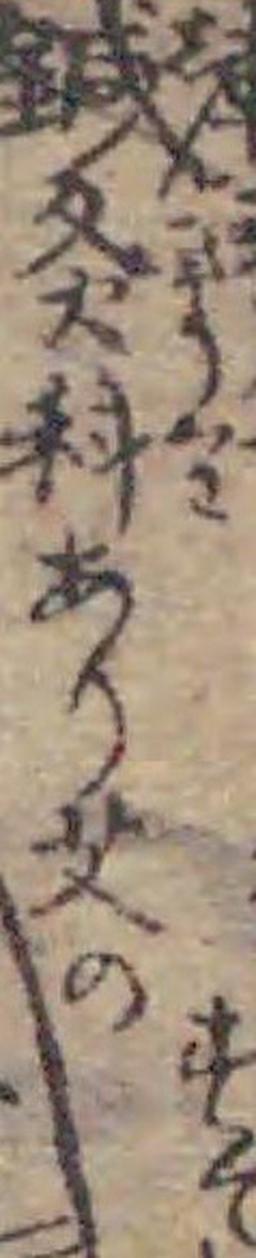鍼灸科あり艾の
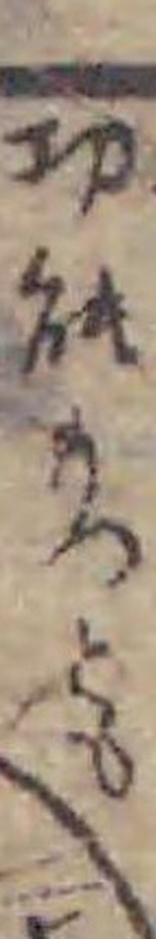功能力もつとも
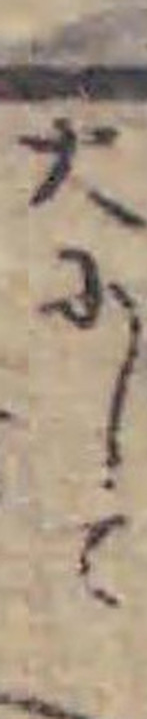大にして
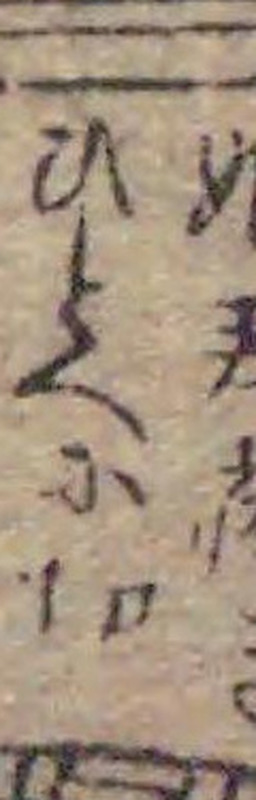ひとへにゑ
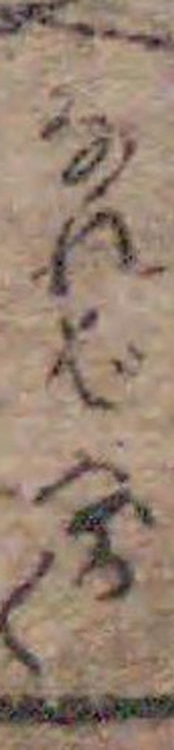なればなか〳〵
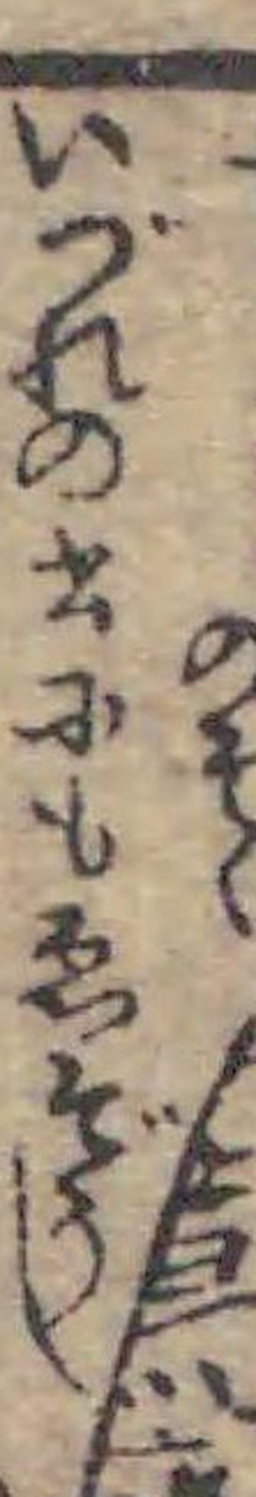いづれの書にもゑぞうし
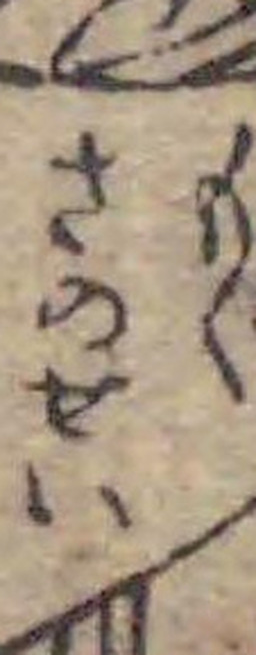さのせい
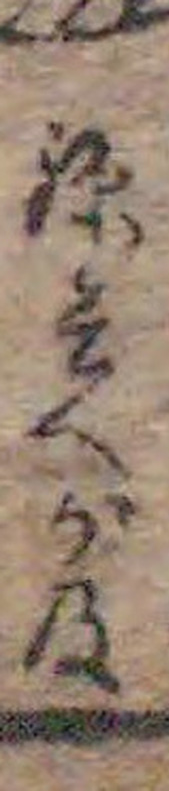孫兵へが及
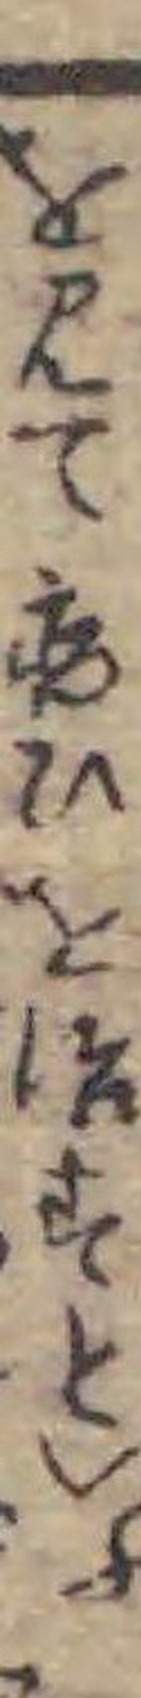を見て病ひを治すといふ
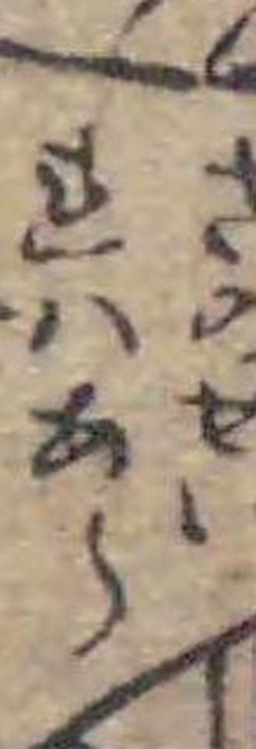れいあら
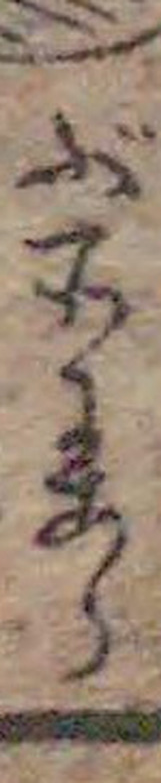ぶ所にあら
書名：三舛増鱗組 : 3巻
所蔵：国立国会図書館 National Diet Library, JAPAN
